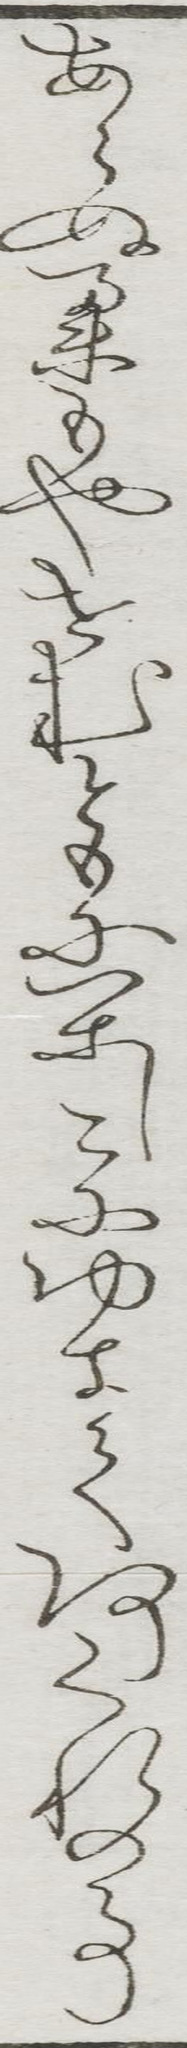あらぬ業もやせむともにかしこにゆきて何くれの事
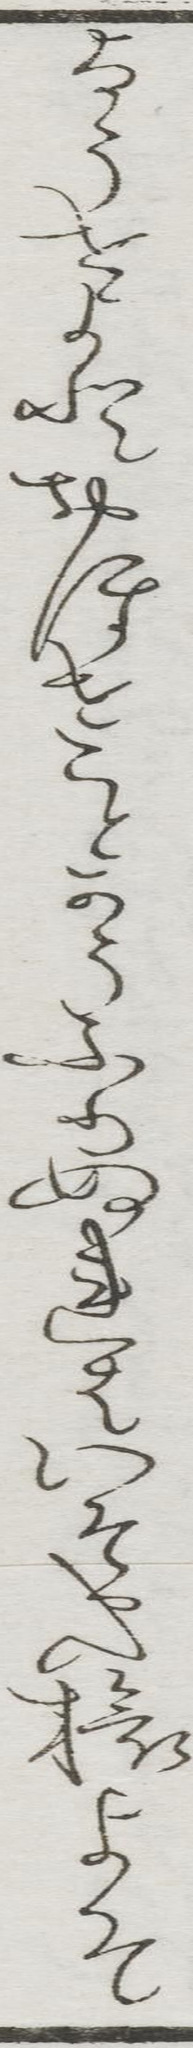ようせよとおほせことかうふりぬれはいそき旅よそ
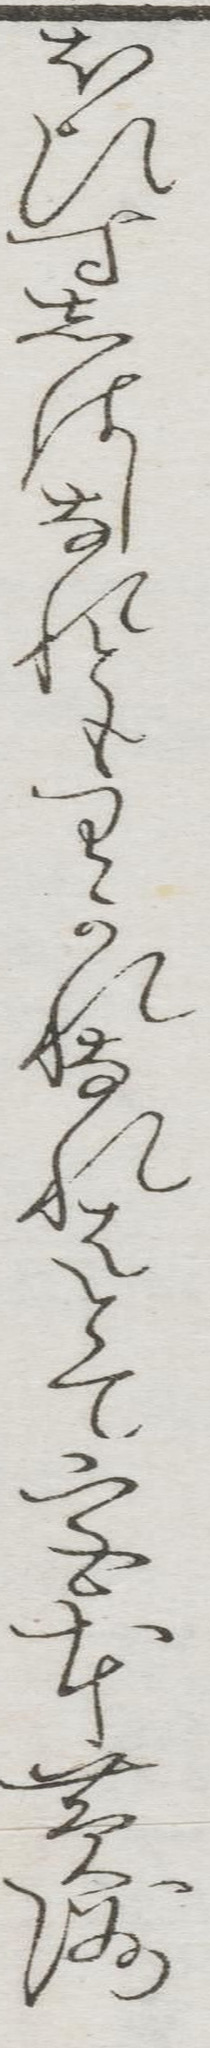ほひすしはしなれともわかれなれはとて宮本黄洲
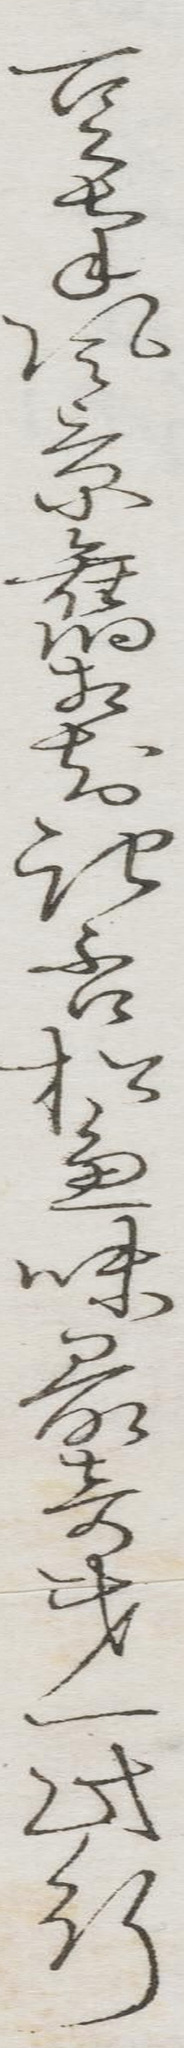豆南風景旧相知記否松魚味最奇第一此行
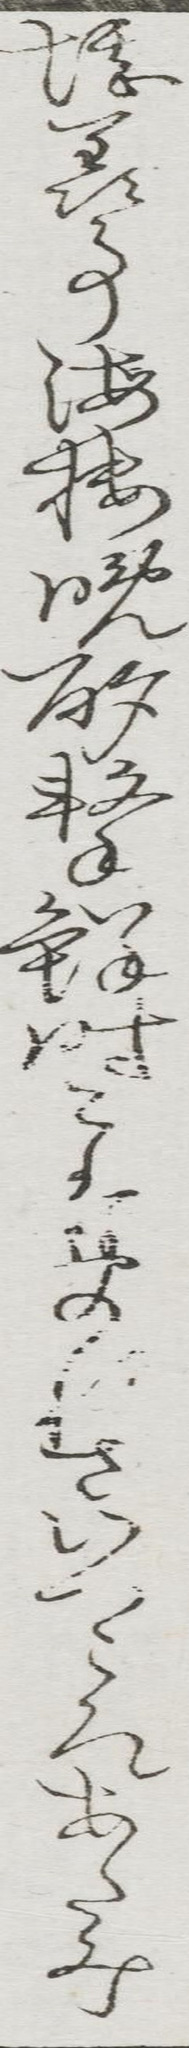堪羨事海楼晩酌撃鮮時こはおのれさいつころあたみ
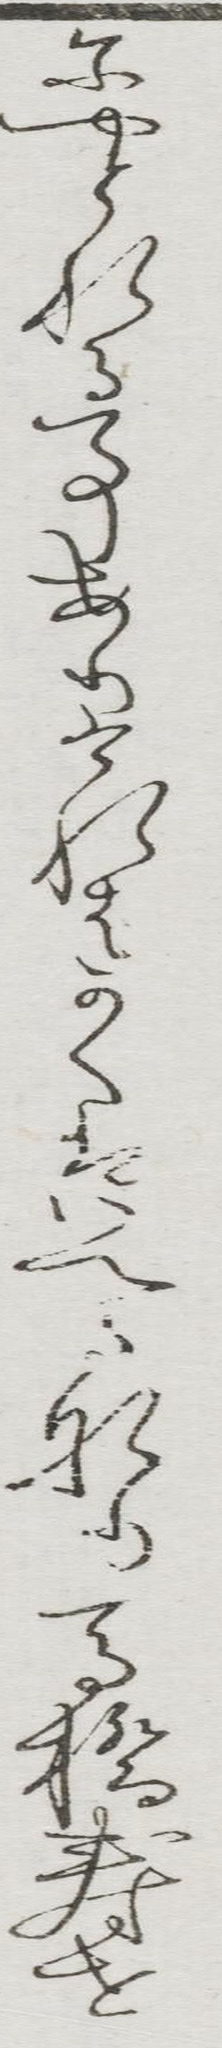にやとれる事ありけれはかくはいへるなり馬橋寿世
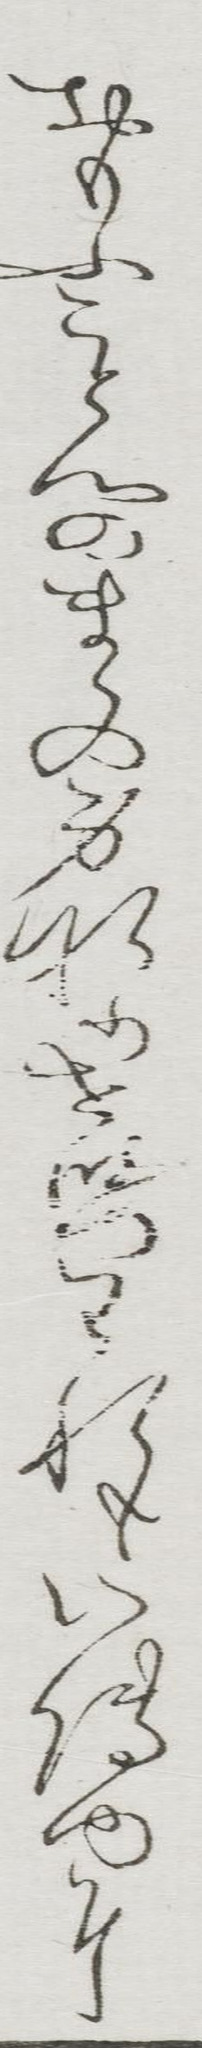おもふこと心のまゝの身なりせはわれもいてゆに
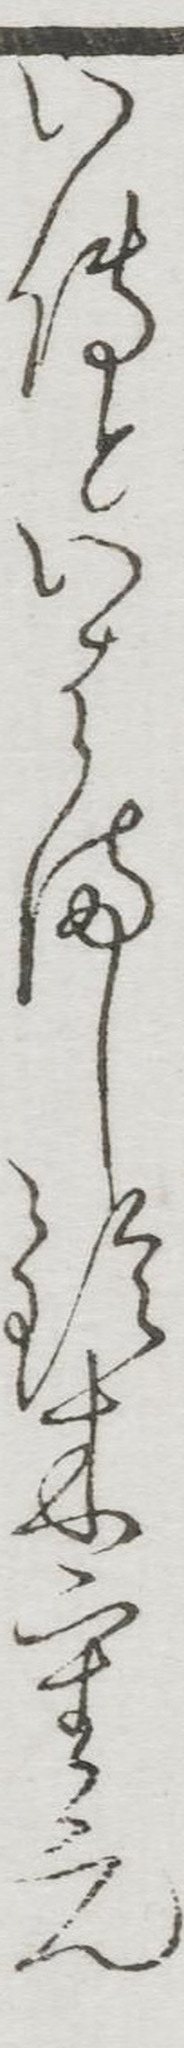いてといはまし鈴木重元
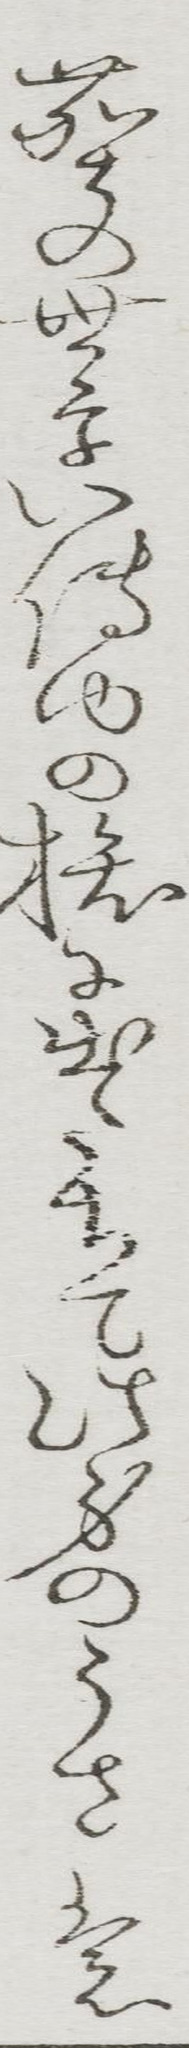夢の世をいてゆの旅に出たちて此身のうさも
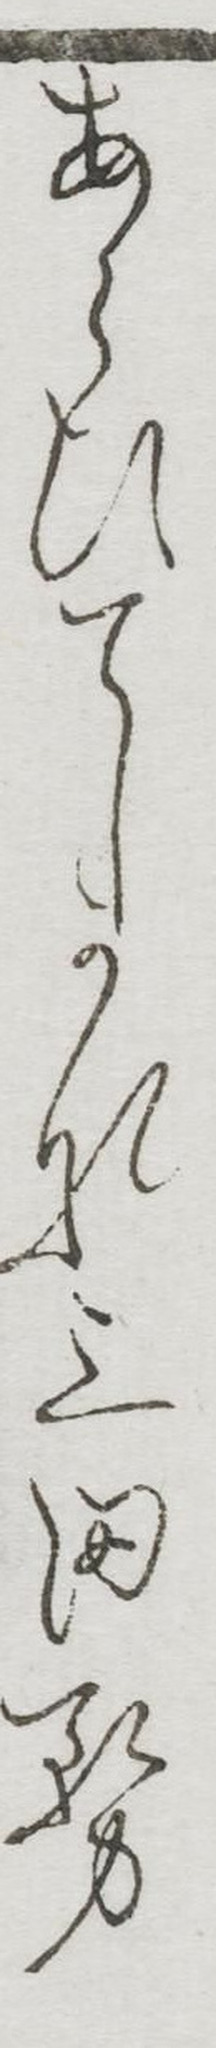あらひしかな三田務
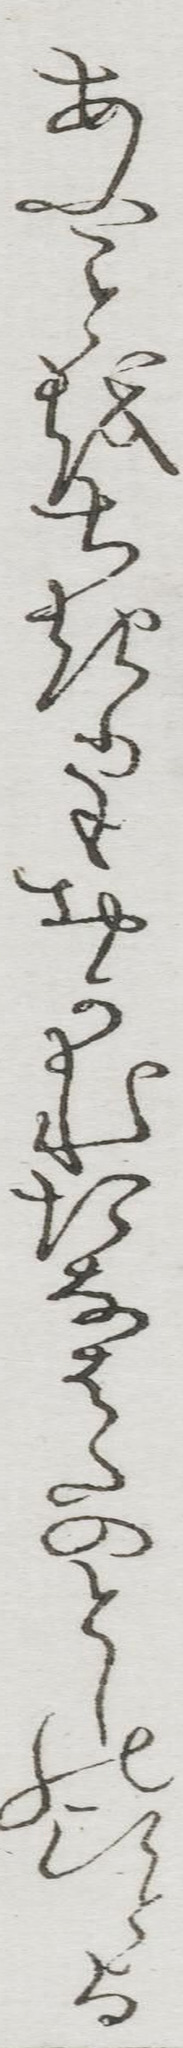あふことをちきりもおかむたなはたのとしのひとよ
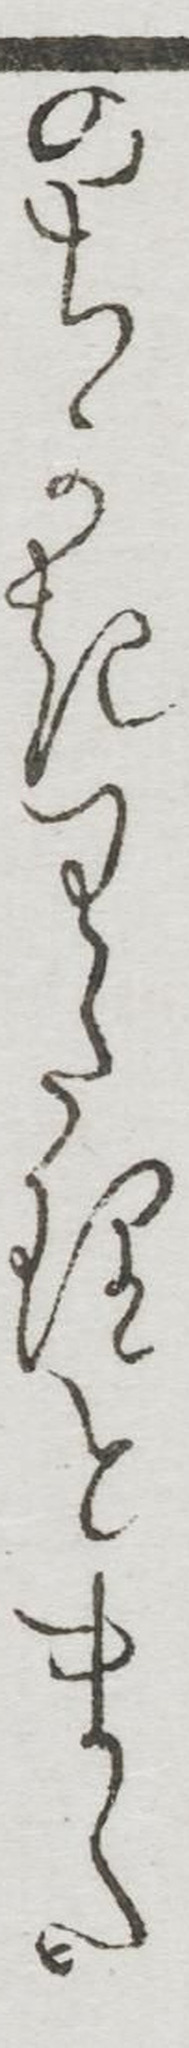のちかきわたりとまた
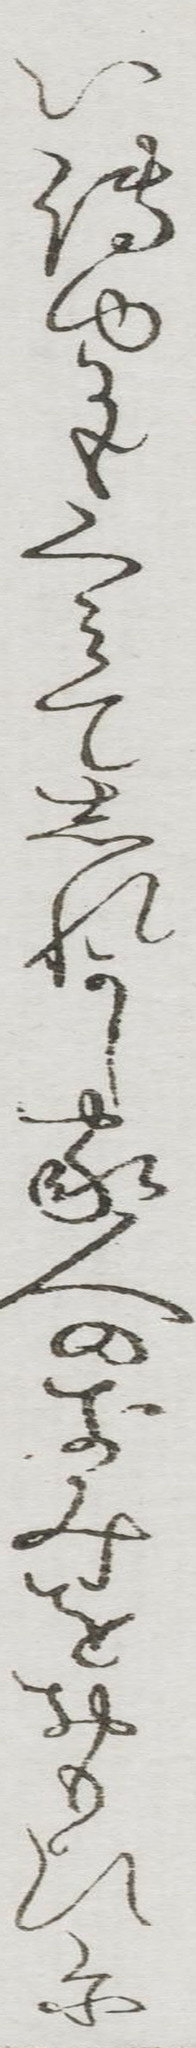いてゆにもくみてしれかし家人のきみをおもひに
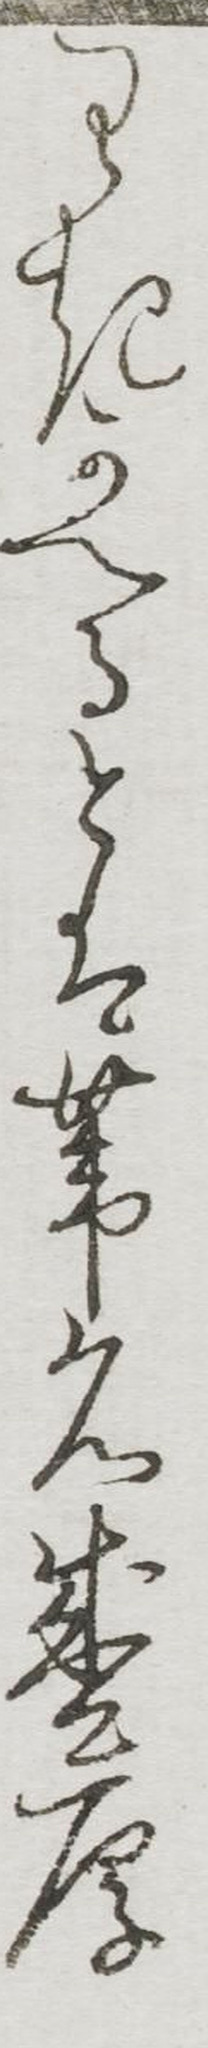わきかへるとは帯名盛厚
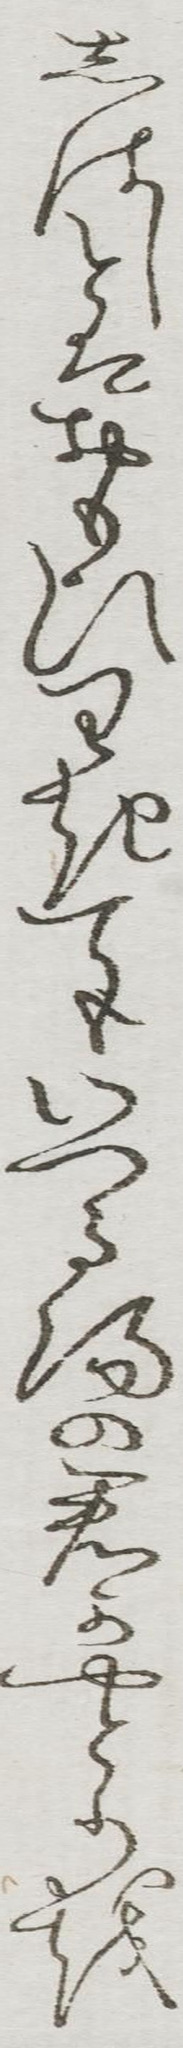しはしとはおもひわきてもいつる湯の君かやとりを

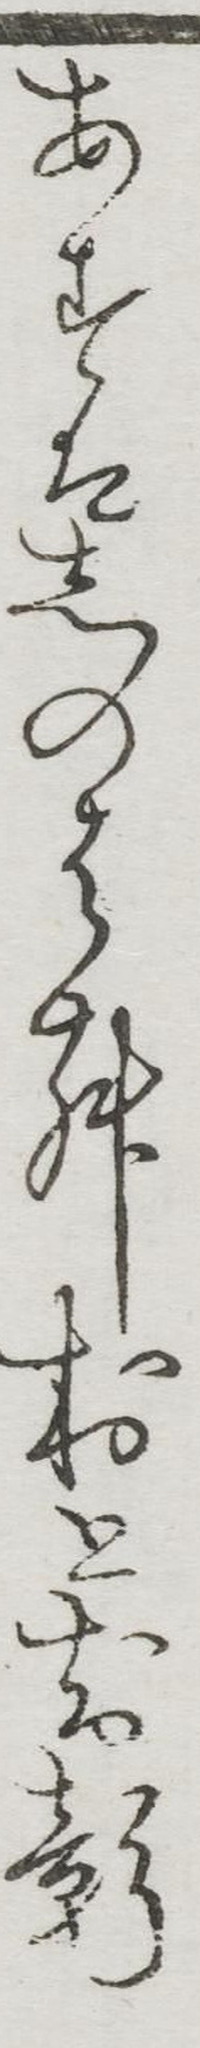あすはしのはむ村上知彰
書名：挿画熱海日記　全
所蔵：東京大学地震研究所図書室 Earthquake Research Institute Library, The University of Tokyo, JAPAN
